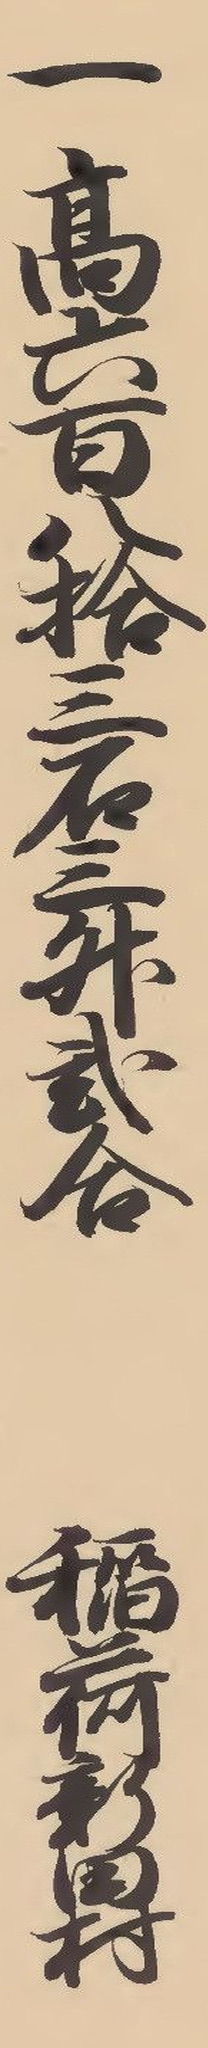一高六百八拾三石三升弐合稲荷新田村
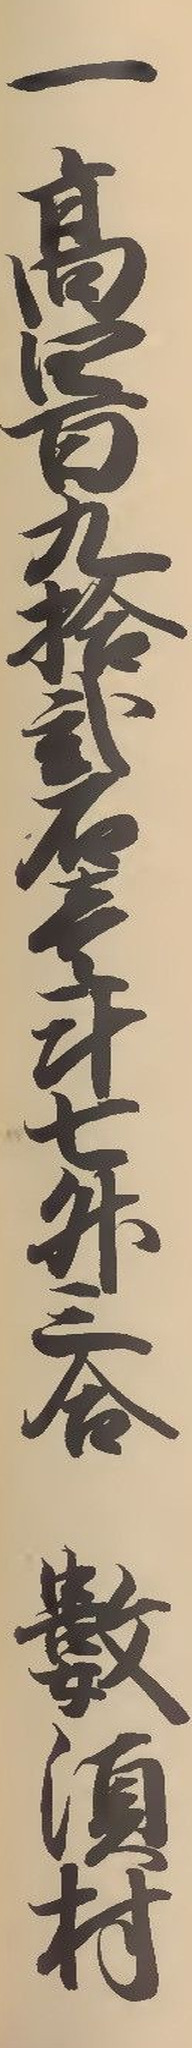一高四百九拾弐石壱斗七升三合数須村
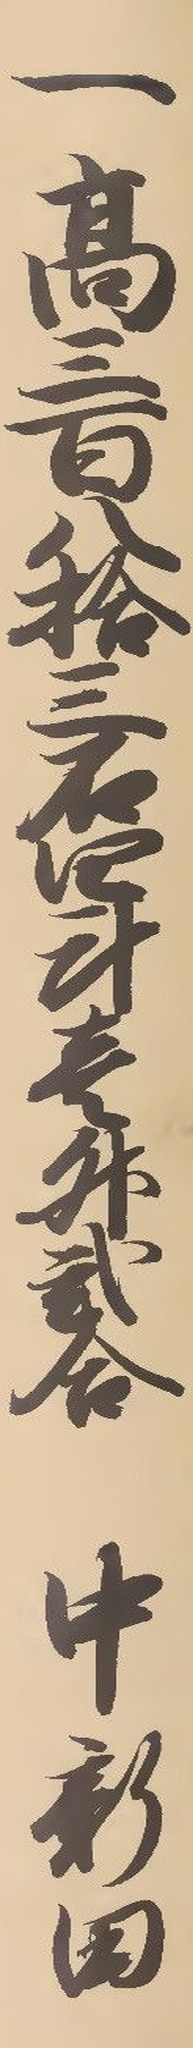一高三百八拾三石四斗壱升弐合中新田
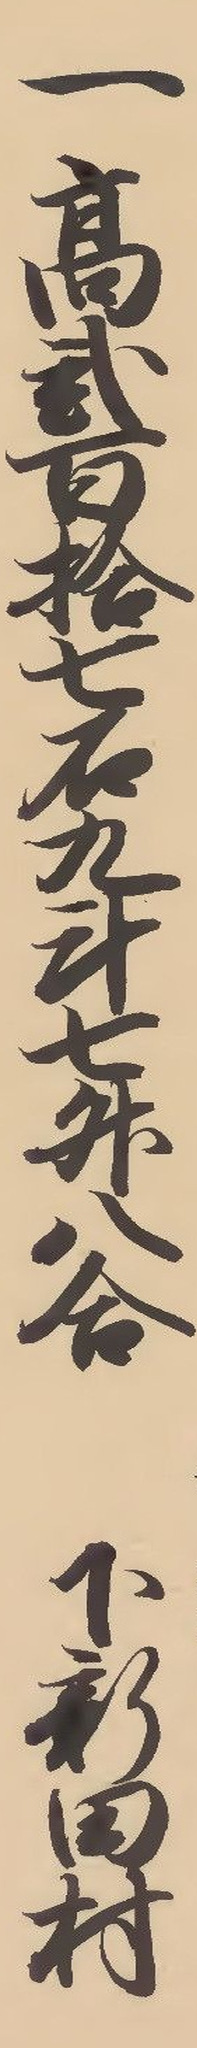一高弐百拾七石九斗七升八合下新田村
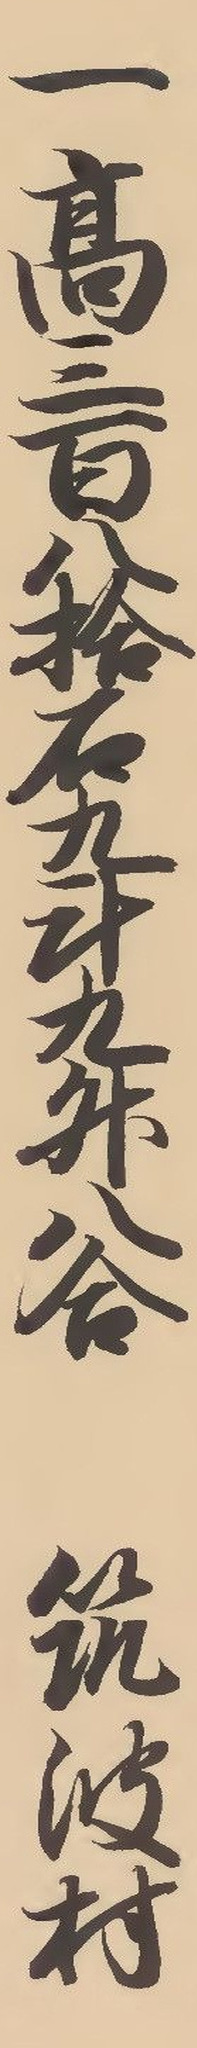一高三百八拾石九斗九升八合筑波村
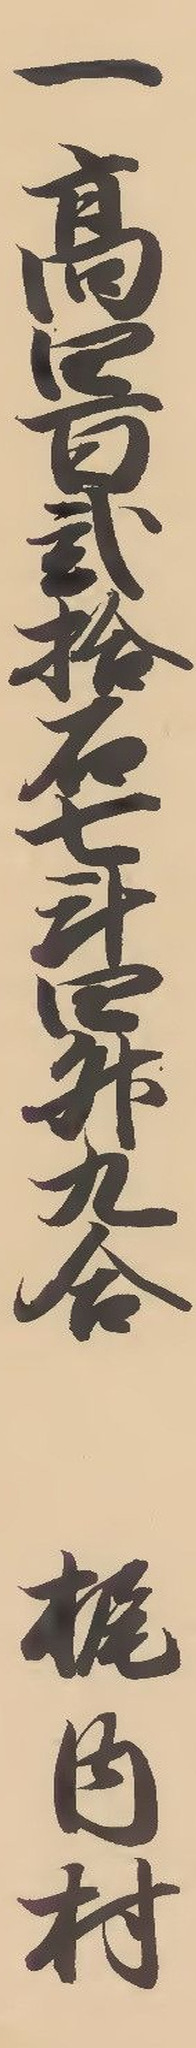一高四百弐拾石七斗四升九合梶内村

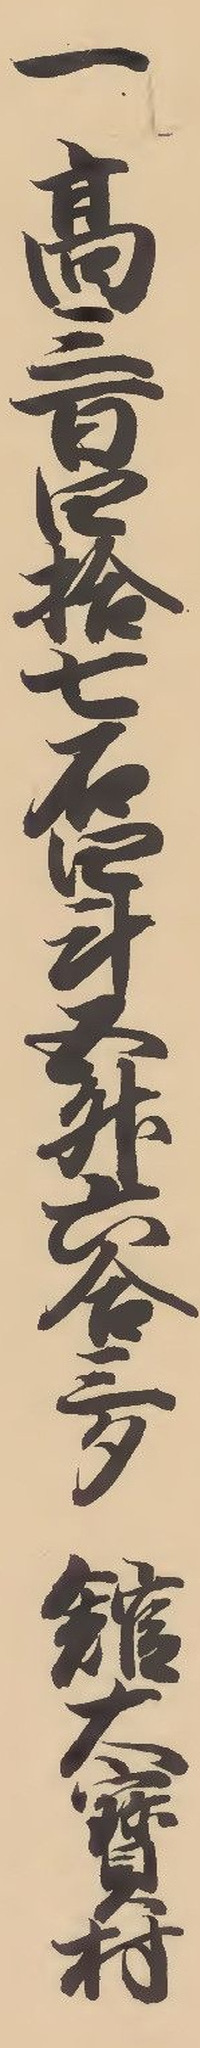一高三百四拾七石四斗五升六合三勺舘大宝村
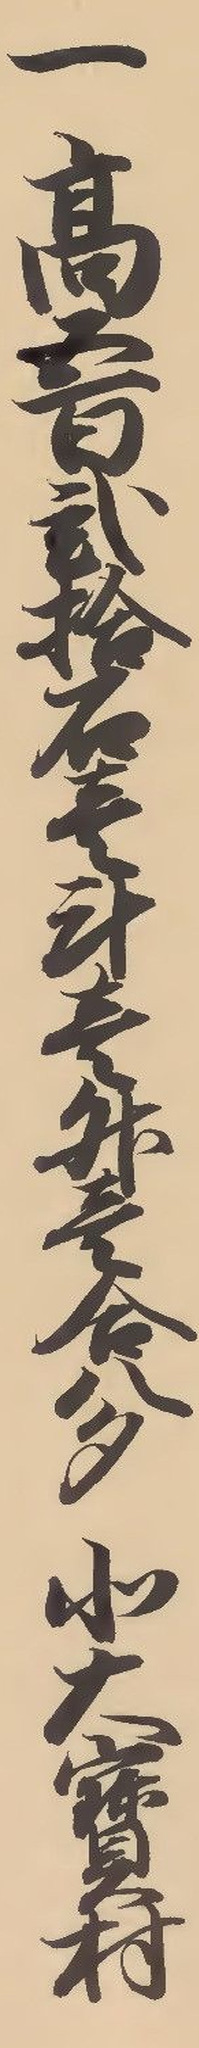一高五百弐拾石壱斗壱升壱合八勺北大宝村
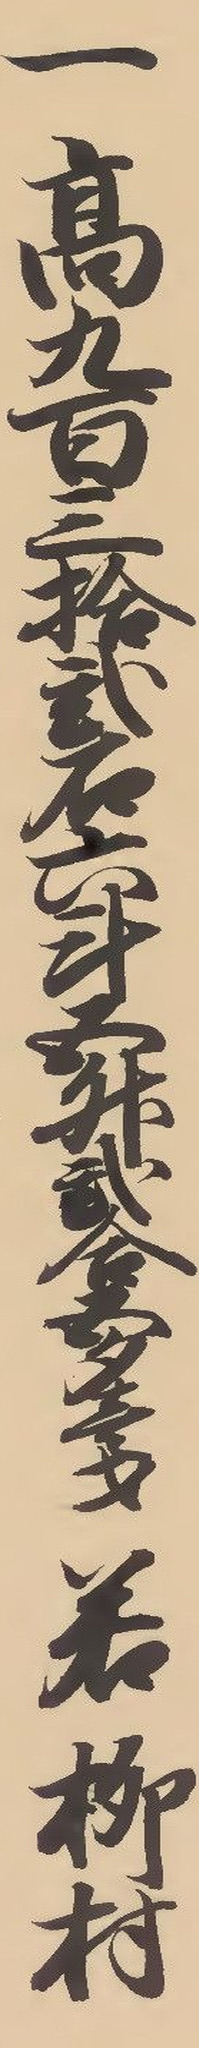一高九百三拾弐石六斗五升弐合五勺壱才若柳村
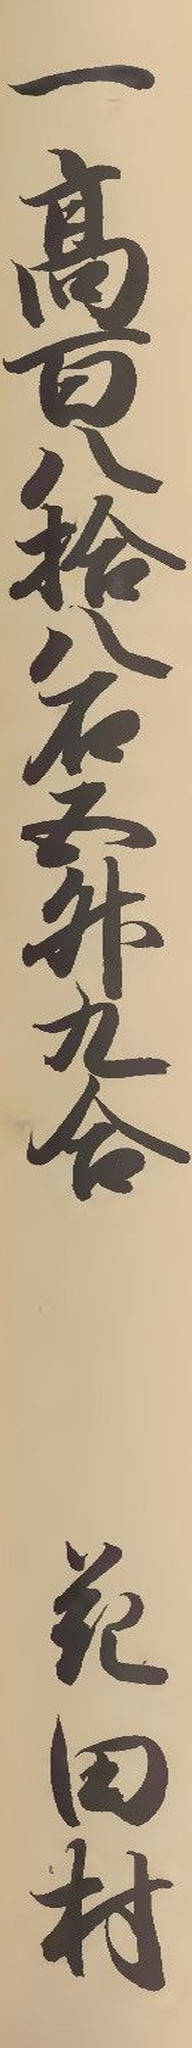一高百八拾八石五升九合花田村
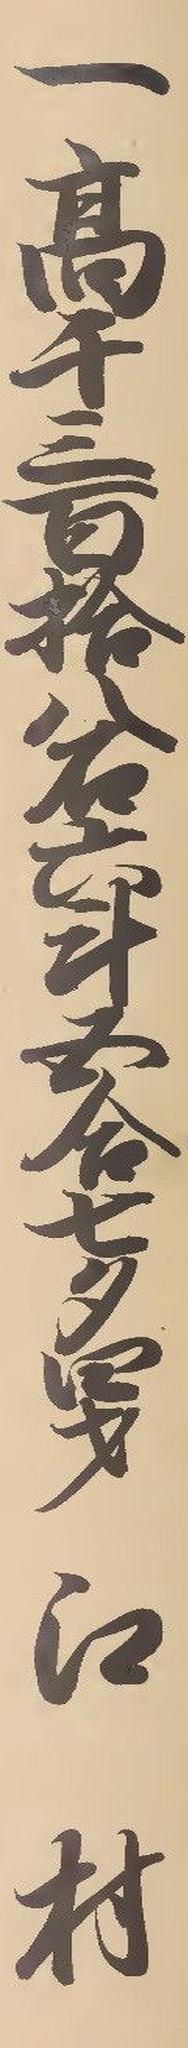一高千三百拾八石六斗五合七勺四才江村
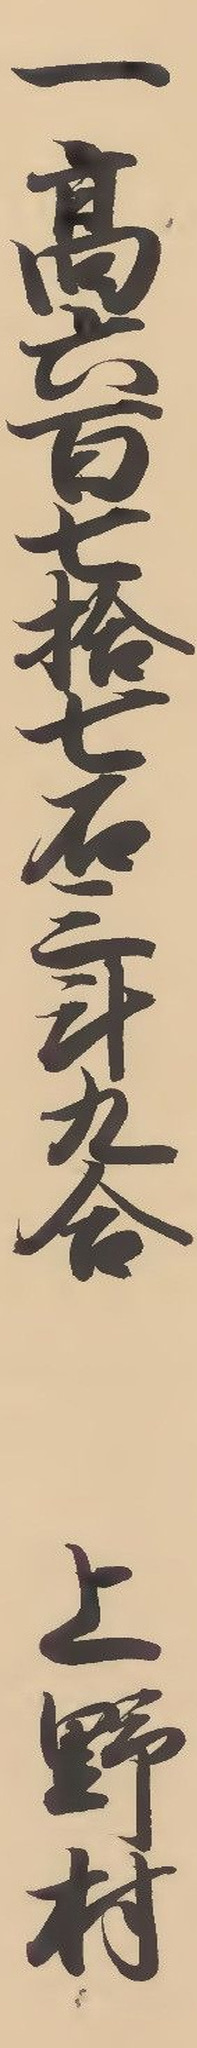一高六百七拾七石三斗九合上野村
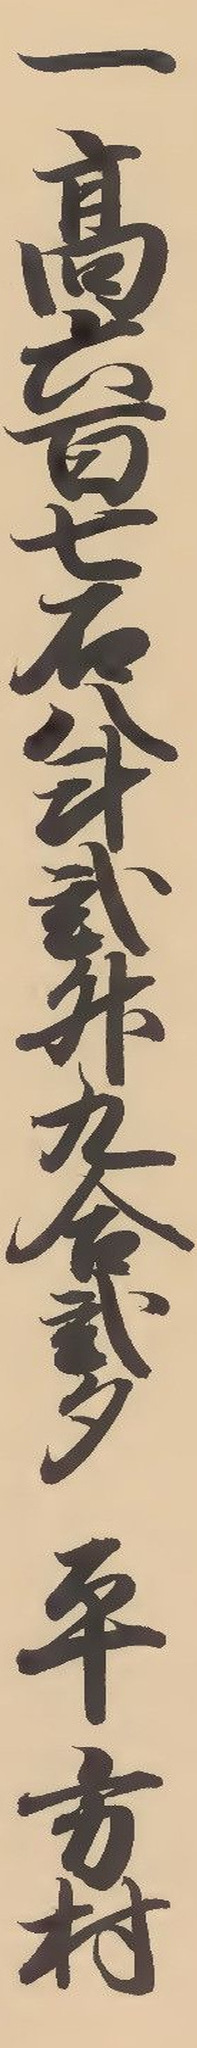一高六百七石八斗弐升九合弐勺平方村
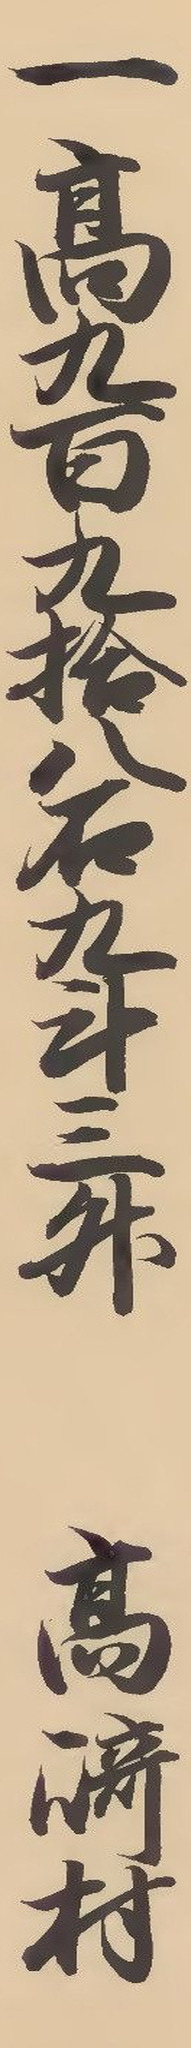一高九百九拾八石九斗三升高崎村

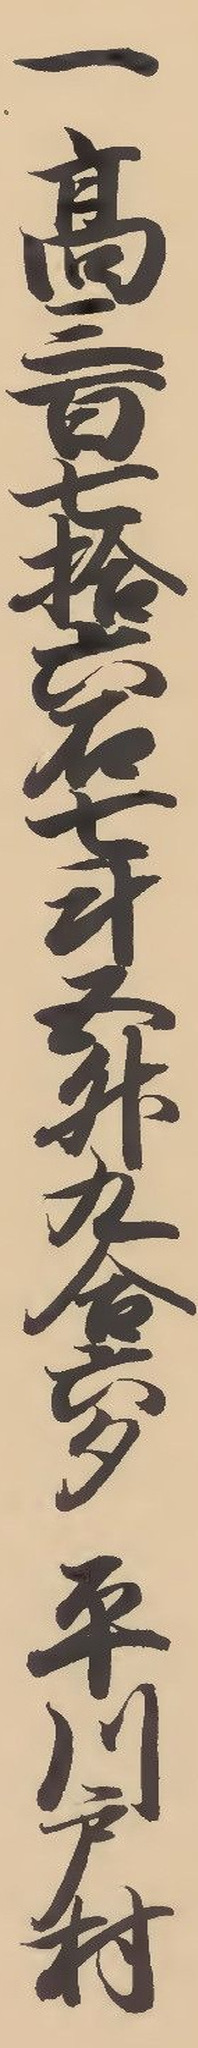一高三百七拾六石七斗五升九合六勺平川戸村
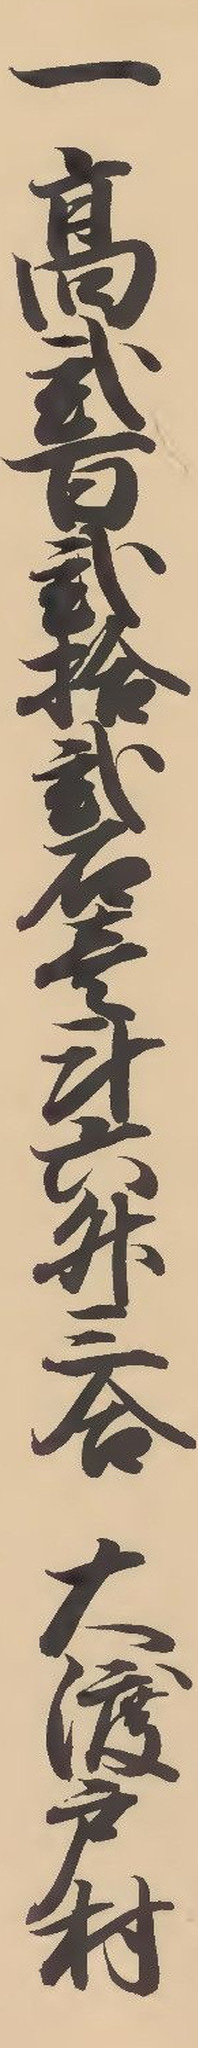一高弐百弐拾弐石壱斗六升三合大渡戸村
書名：常陸国郷帳
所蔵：国立公文書館 National Archives of Japan
